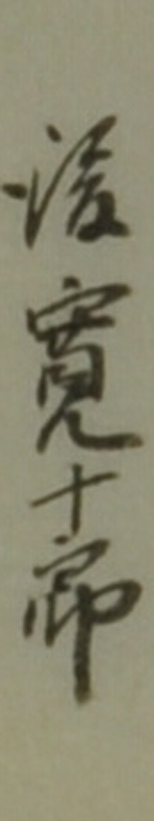後勘十郎
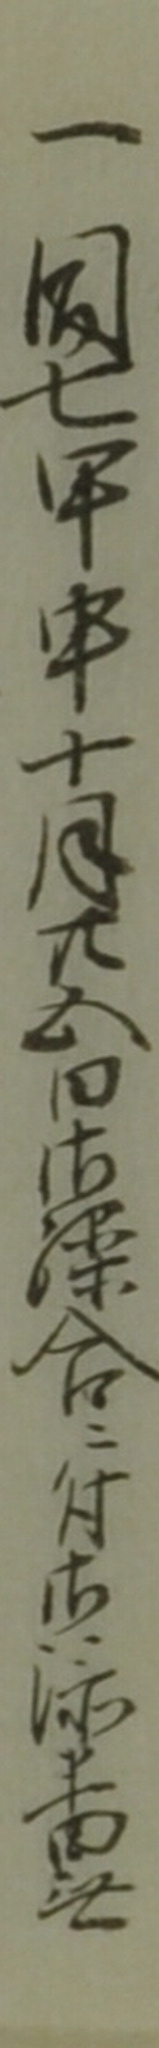一同七年申十月廿五日御繰合に付御添番無
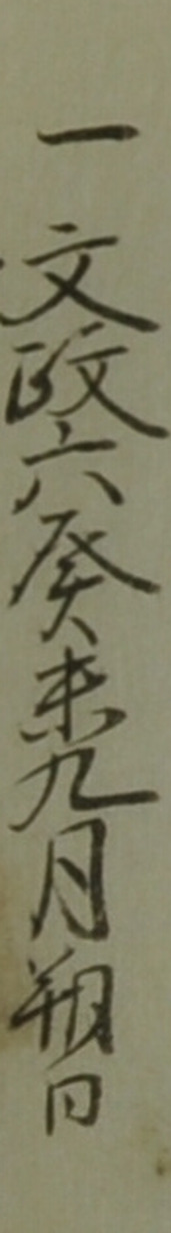一文政六癸未九月朔日
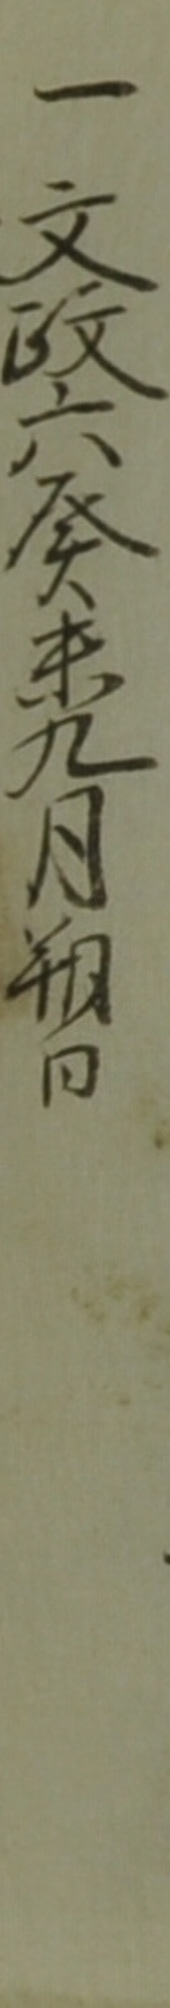一文政六癸未九月朔日
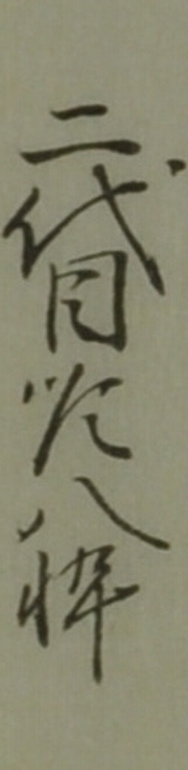二代目順八忰
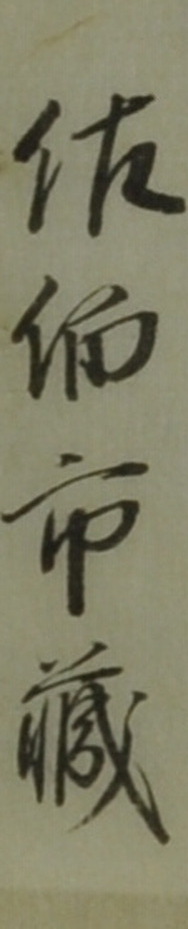佐伯市蔵
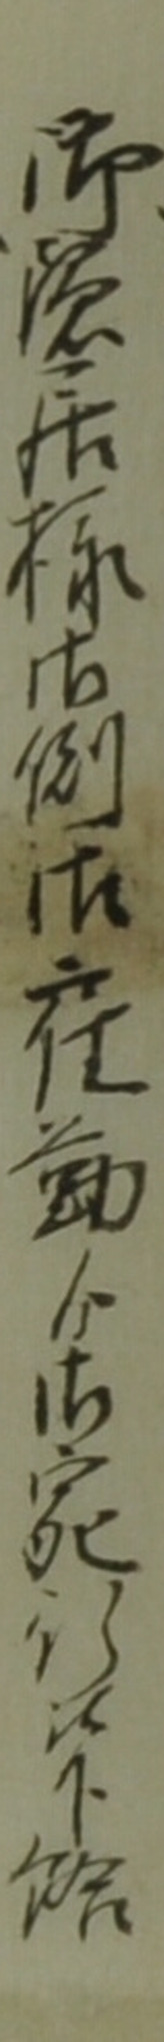御隠居様御側御雇勤より御宛行被下給
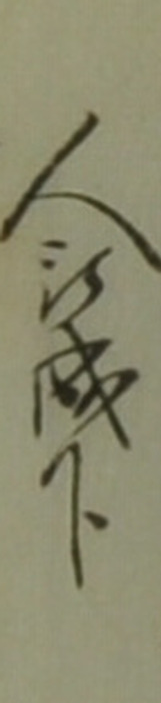人被成下
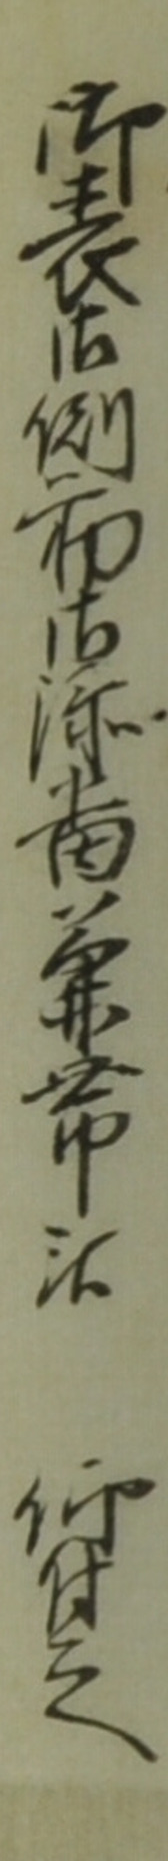御表御側勤御添番兼帯被仰付之

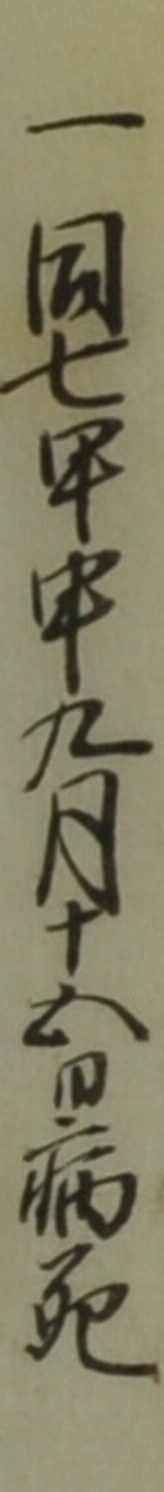一同七甲申九月十五日病死
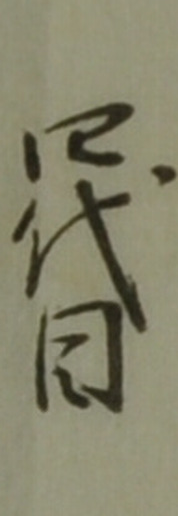四代目
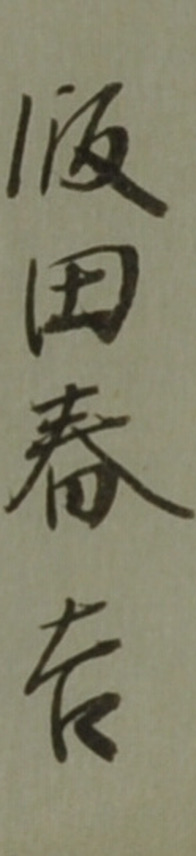飯田春吉
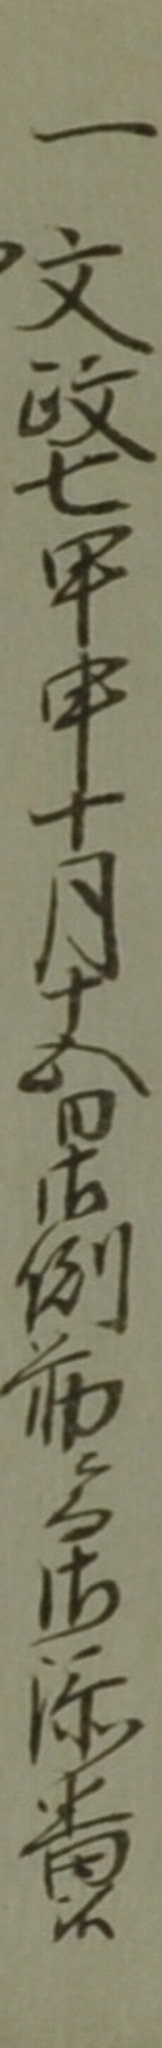一文政七甲申十月十五日御側勤ニ而御添番被
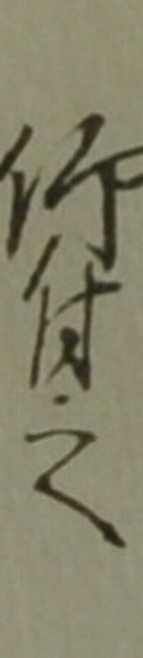仰付之
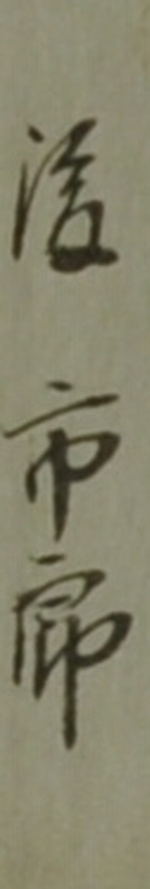後市郎
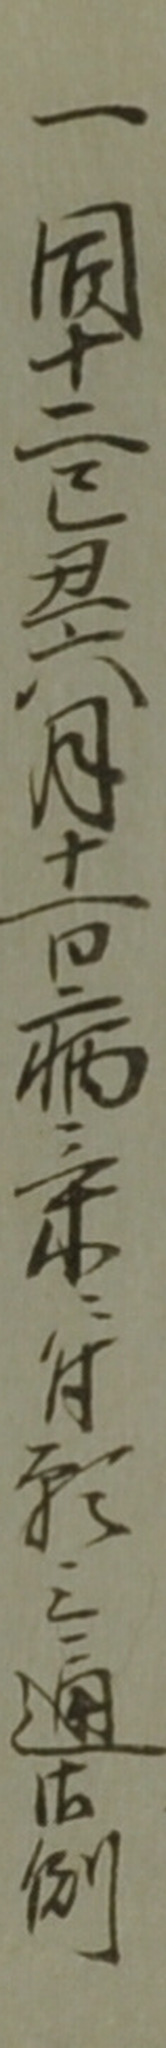一同十二己丑六月十一日病気ニ付願之通御側
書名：諸御役代々録（八）
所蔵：伊那市立高遠町図書館・合同会社AMANE
